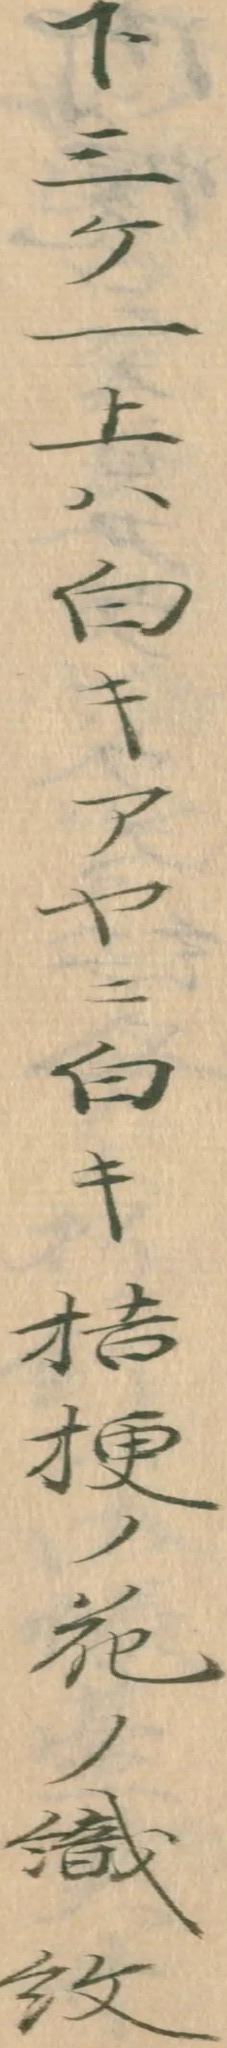下三ケ一上ハ白キアヤニ白キ桔梗ノ花ノ織紋
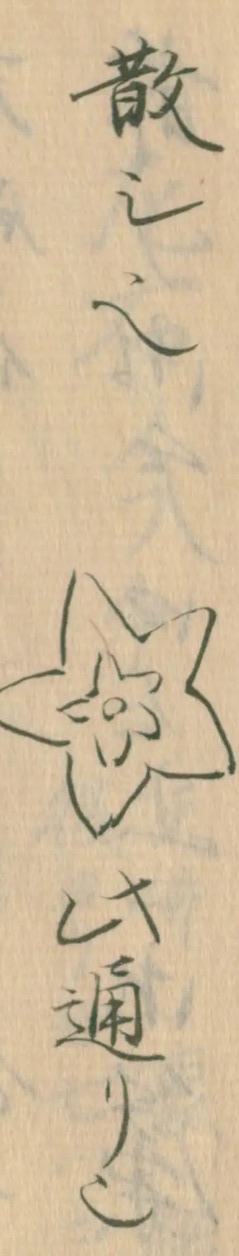散シ也此通り也
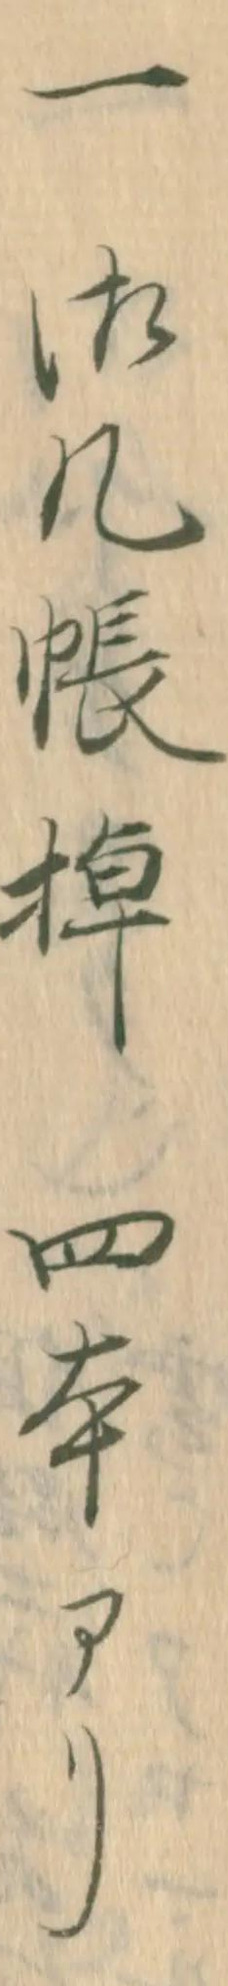一御几帳棹四本アリ
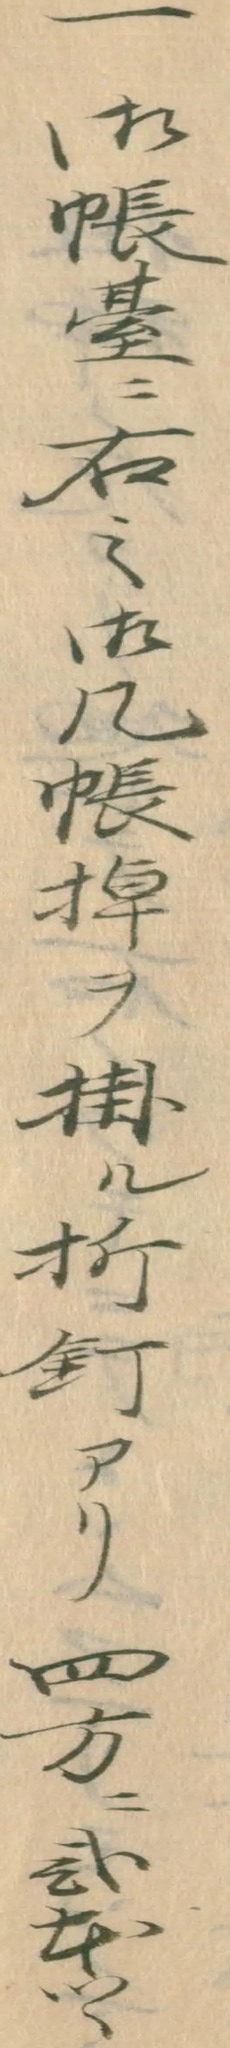一御帳台ニ右之御几帳棹ヲ掛ル折釘アリ四方ニ弐本ツヽ
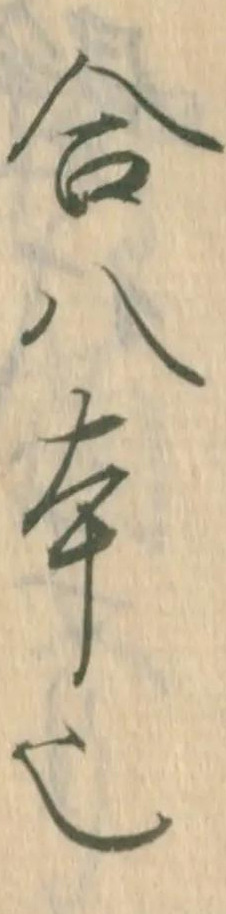合八本也
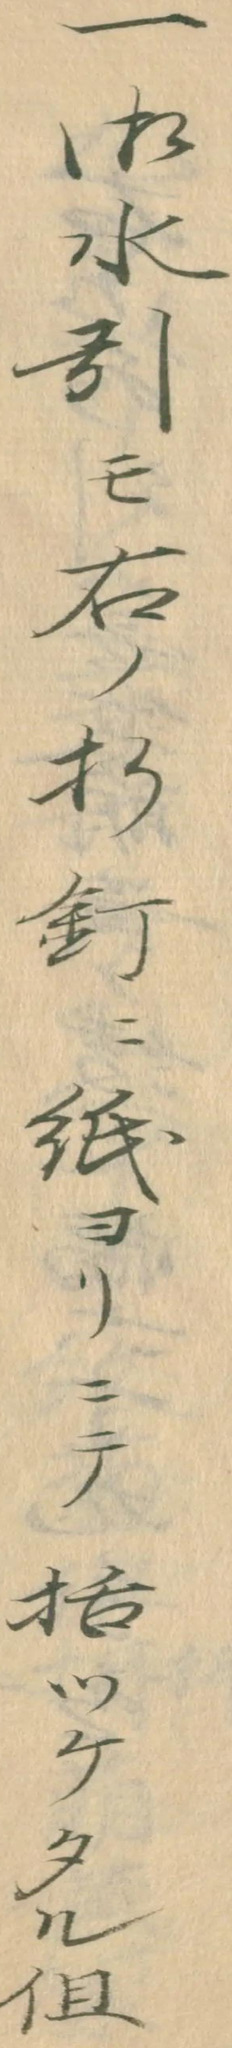一御水引モ右ノ折釘ニ紙ヨリニテ括ツケタル但
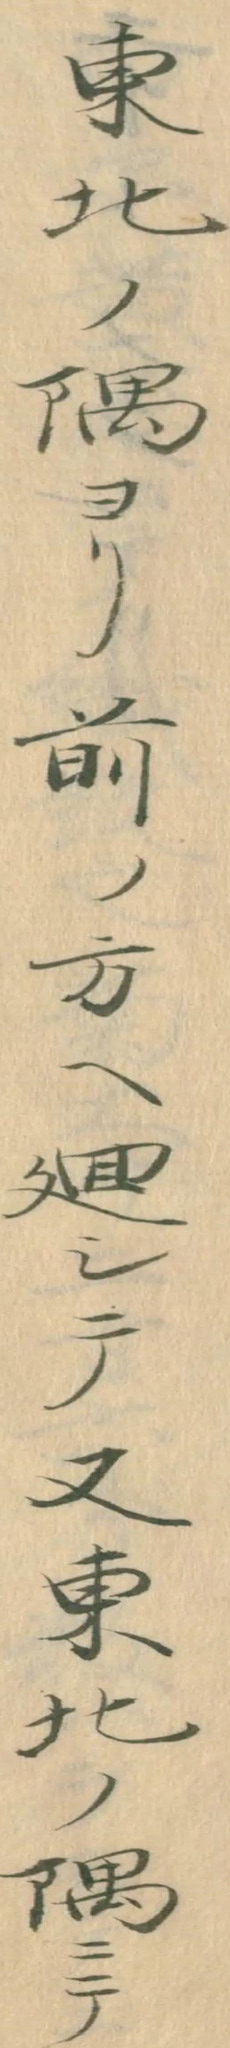東北ノ隅ヨリ前ノ方へ廻シテ又東北之隅ニテ

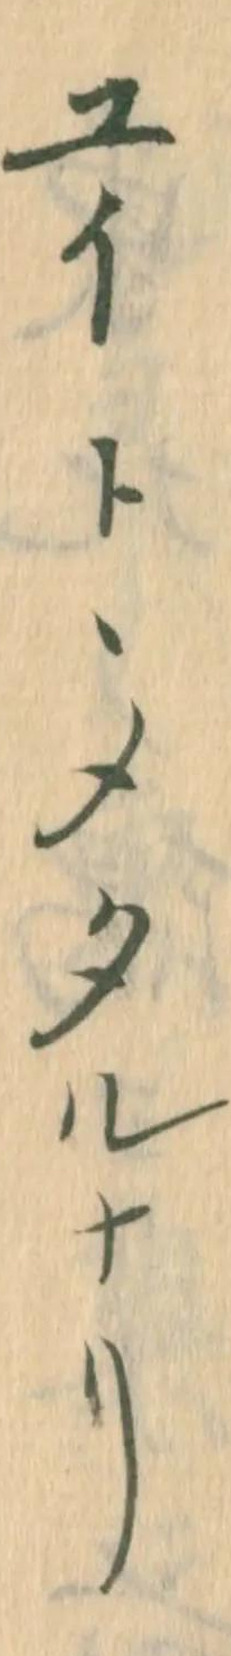ユイトヽメタルナリ
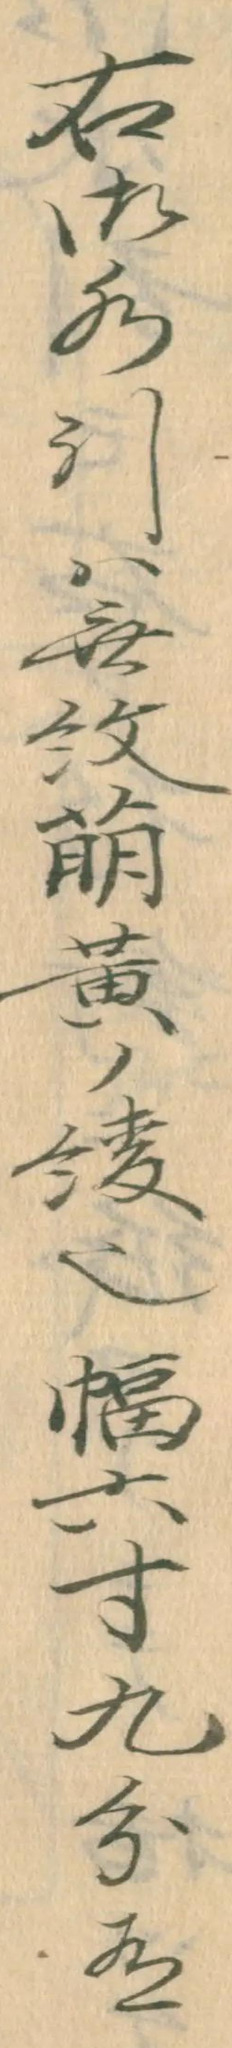右御水引ハ無紋萌黄ノ綾也幅六寸九分有
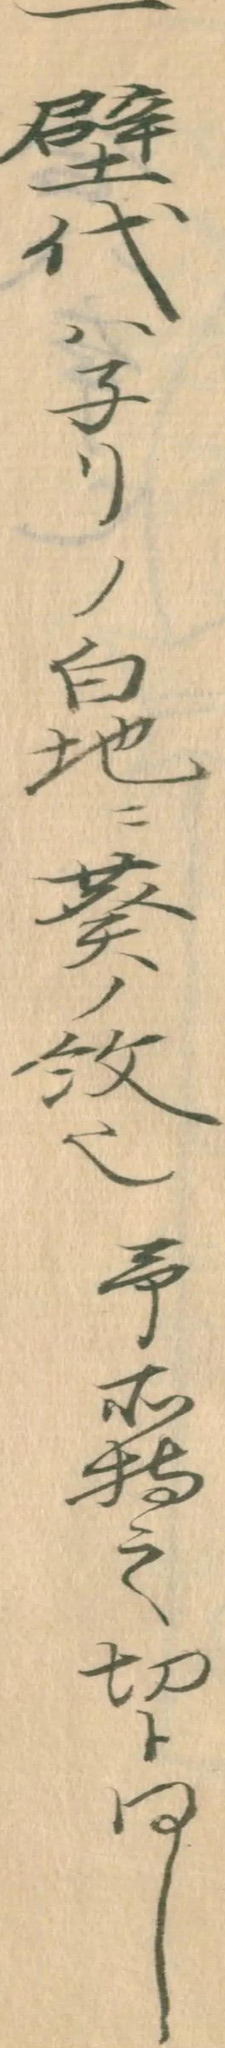一壁代ハ子リノ白地ニ葵ノ紋也予所持之切ト同し
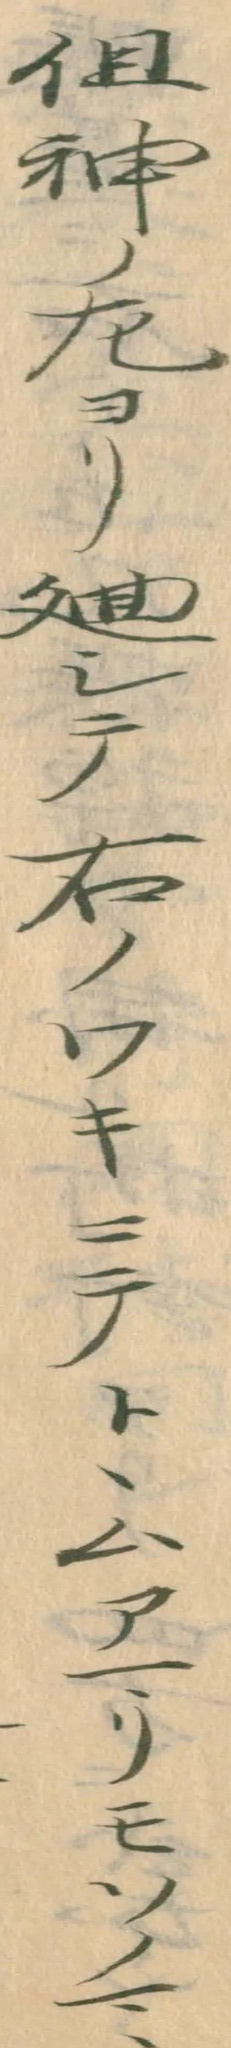但神ノ左ヨリ廻シテ右ノワキニテトヽムアマリモソノマヽ
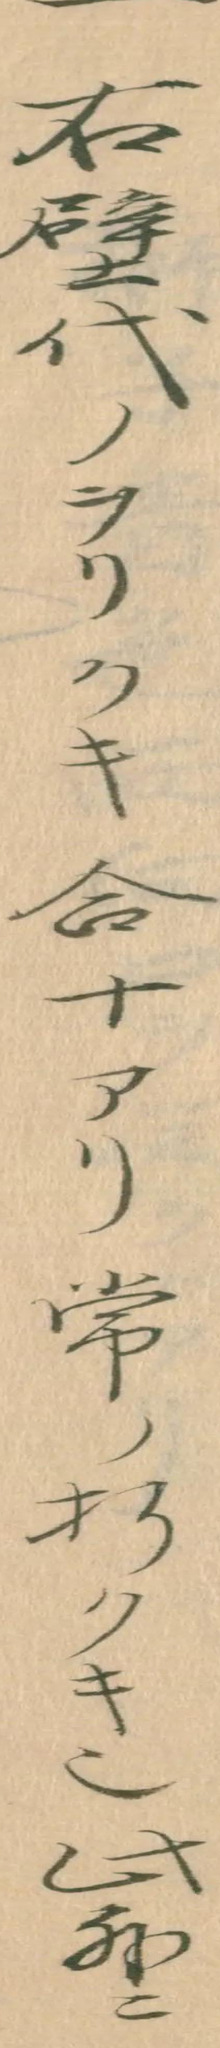一右壁代ノヲリクキ合十アリ常ノ折クキ也此外ニ
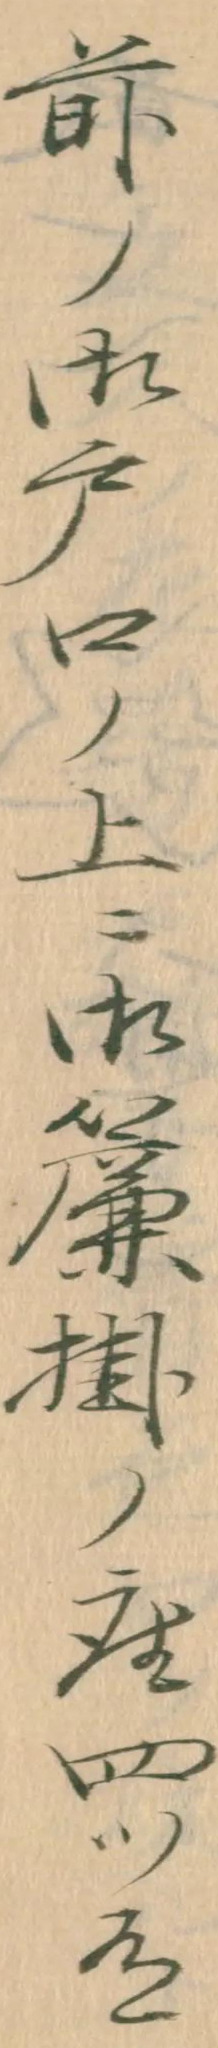前ノ御戸口ノ上ニ御簾掛ノ座四ツ有
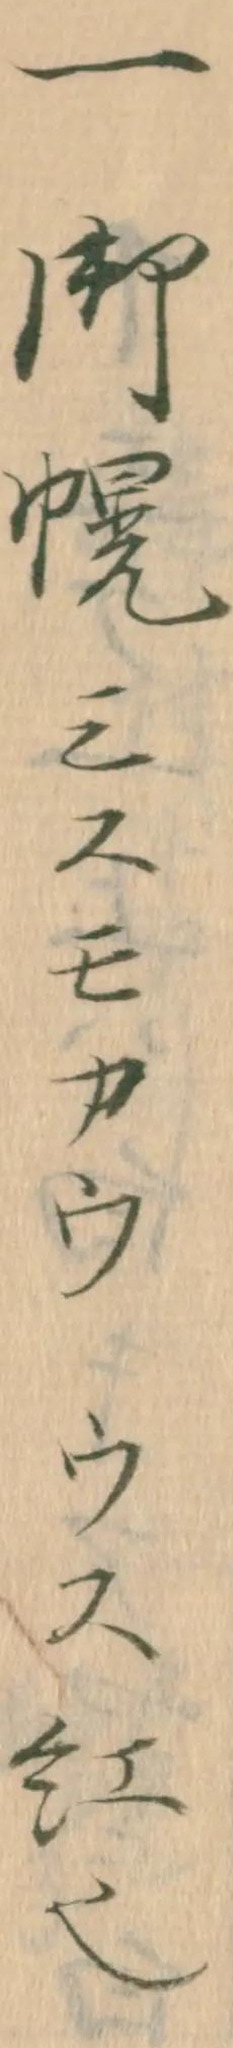一御幌ミスモカウウス紅也
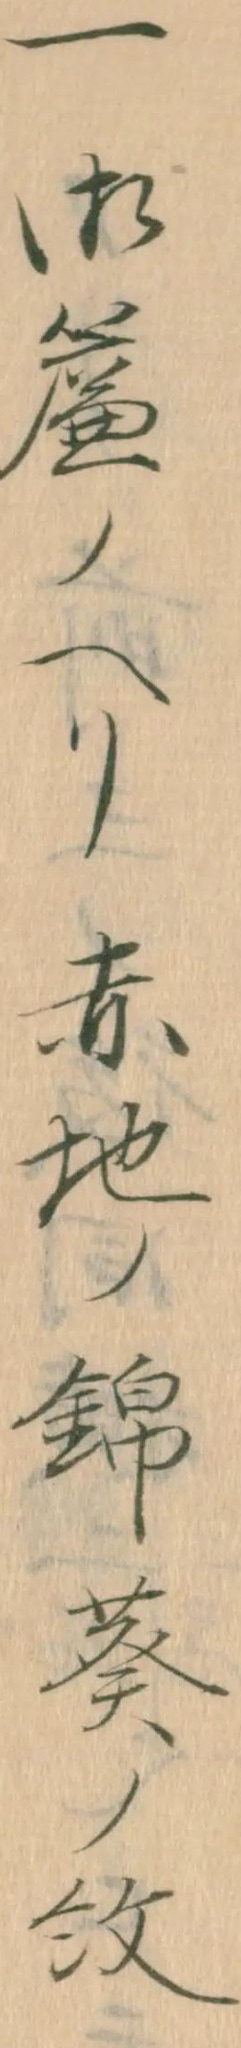一御簾ノヘリ赤地ノ錦葵ノ紋
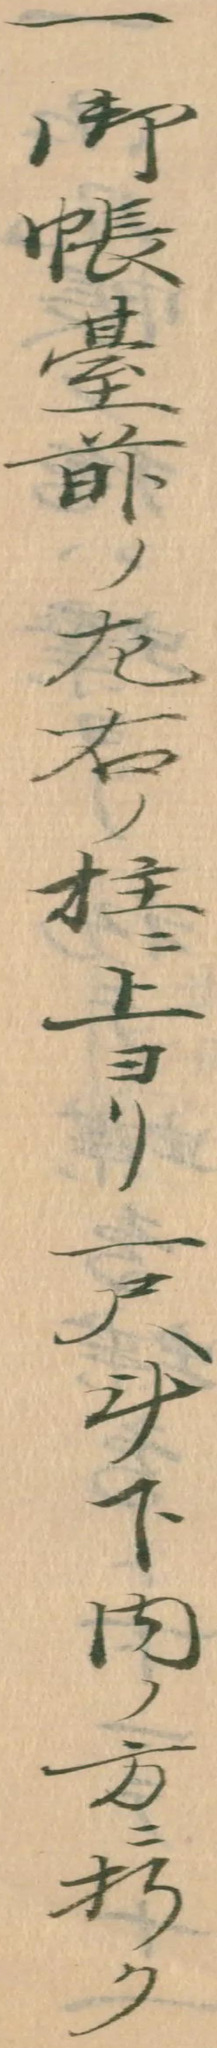一御帳台前ノ左右ノ柱ニ上ヨリ一尺計下内ノ方ニ折ク
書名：賀茂社記録. 第15冊
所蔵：国立国会図書館 National Diet Library, JAPAN
